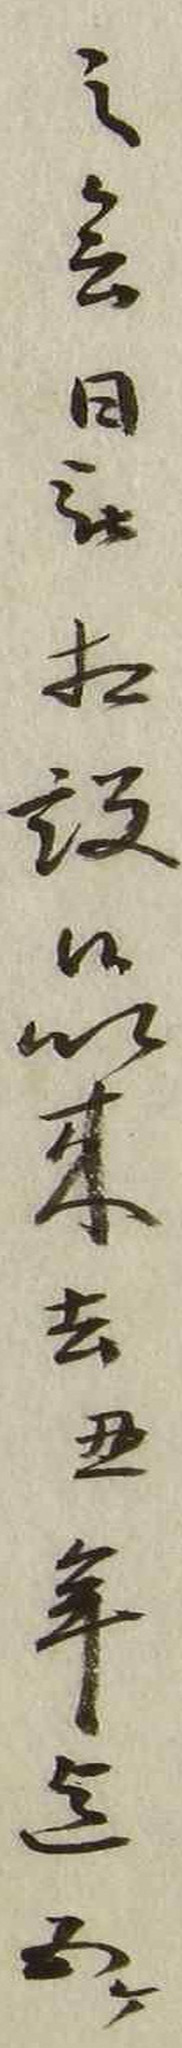之会日被相設候以来去丑年迄五ケ
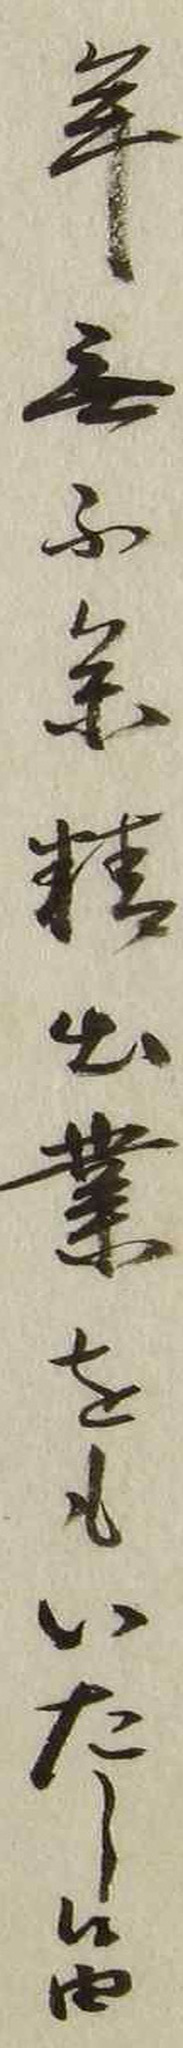年無不参精出業をもいたし候由
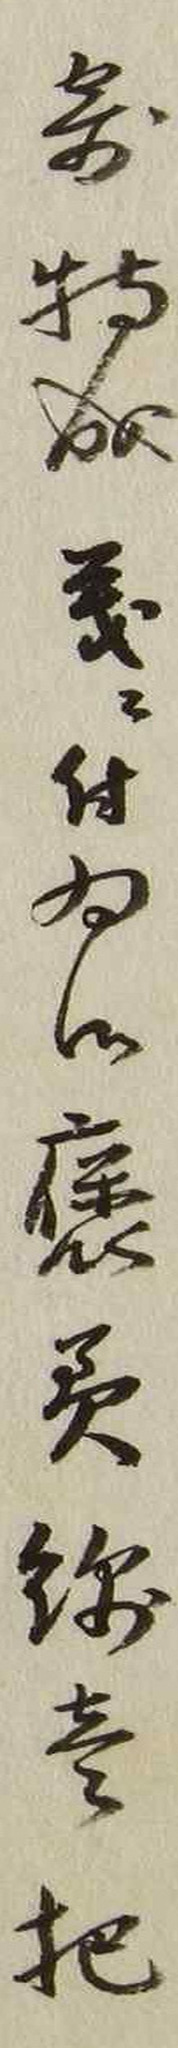奇特成義ニ付為御褒美綿壱把
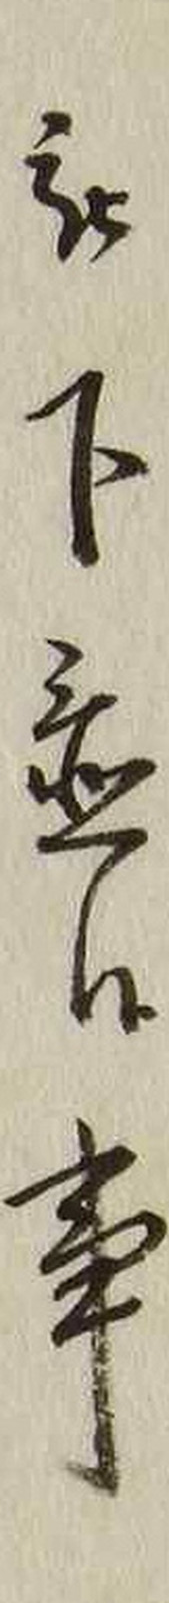被下置候事
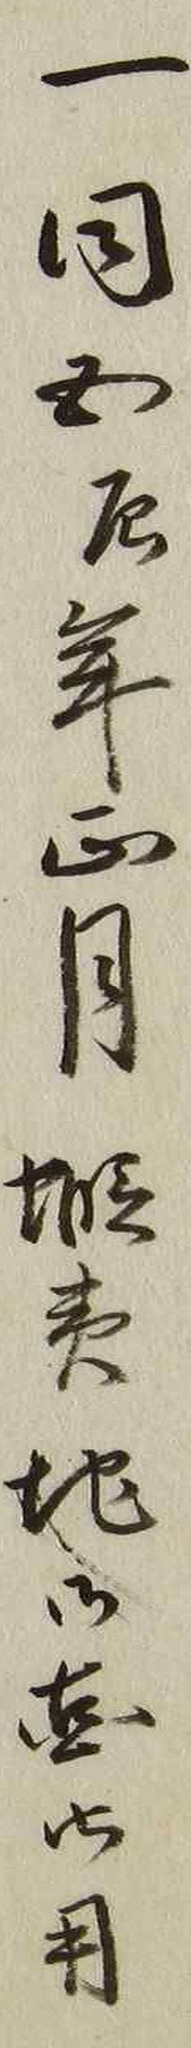一同五辰年正月蝦夷地御固御用
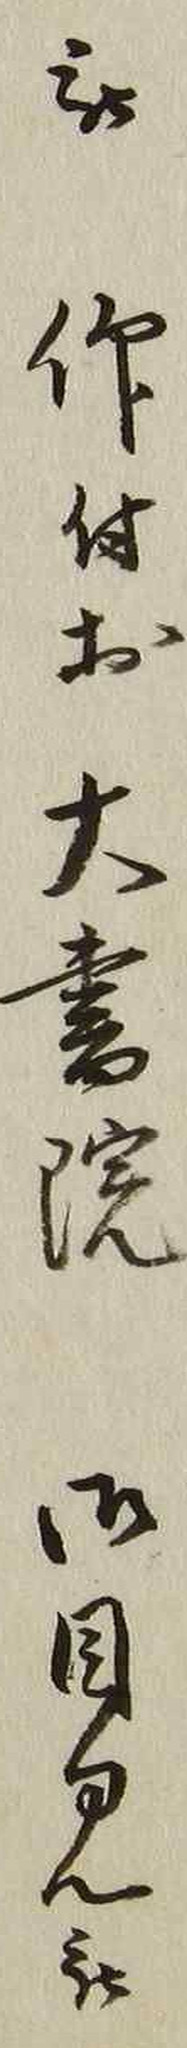被仰付於大書院御目見被
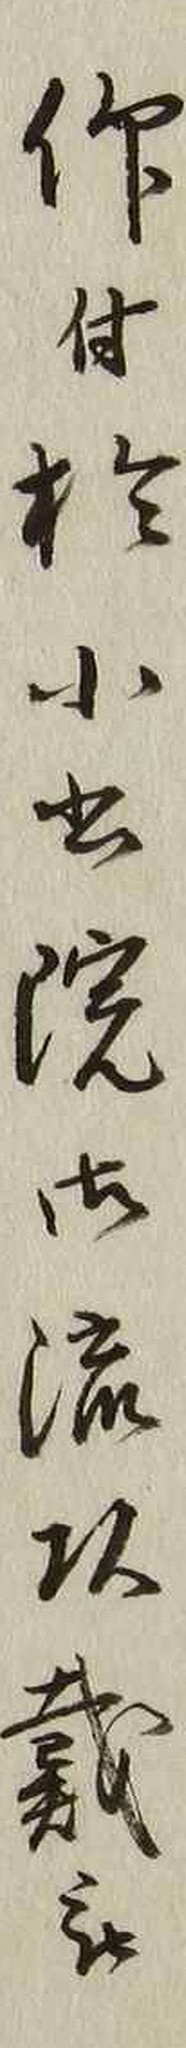仰付於小書院御流頂戴被
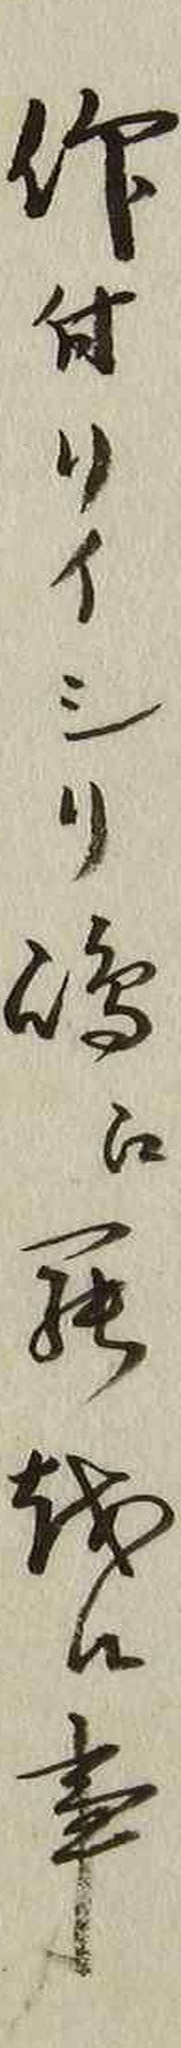仰付リイシリ島江罷越候事
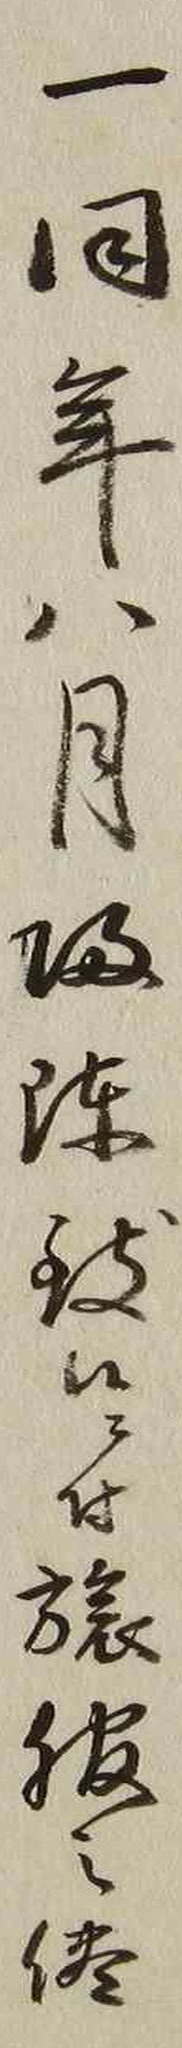一同年八月帰陳致候ニ付旅服之儘
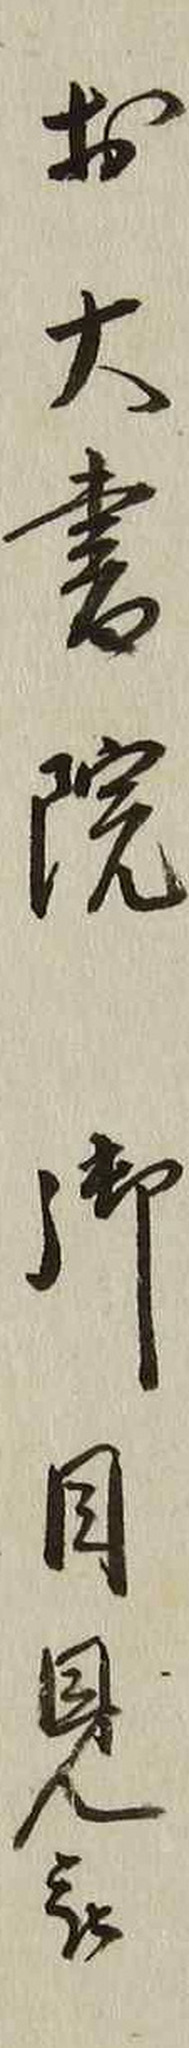於大書院御目見被
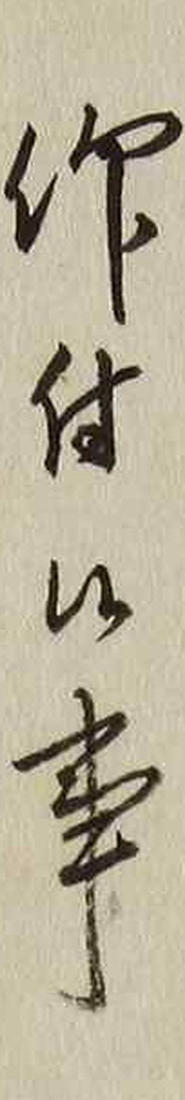仰付候事
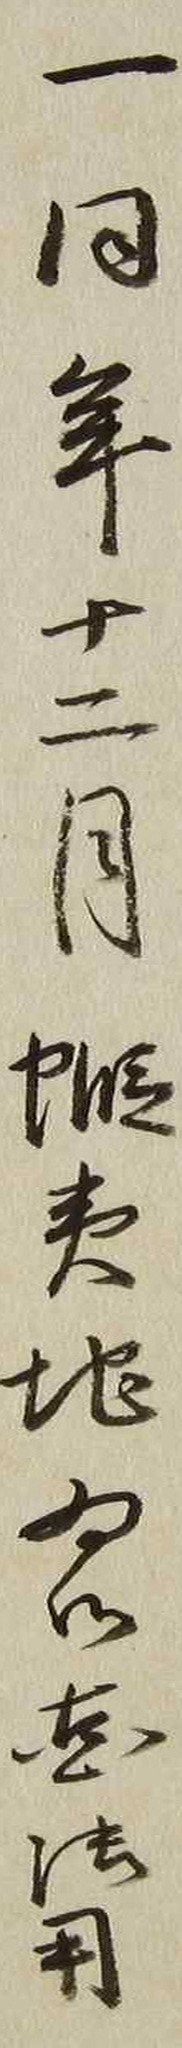一同年十二月蝦夷地為御固御用
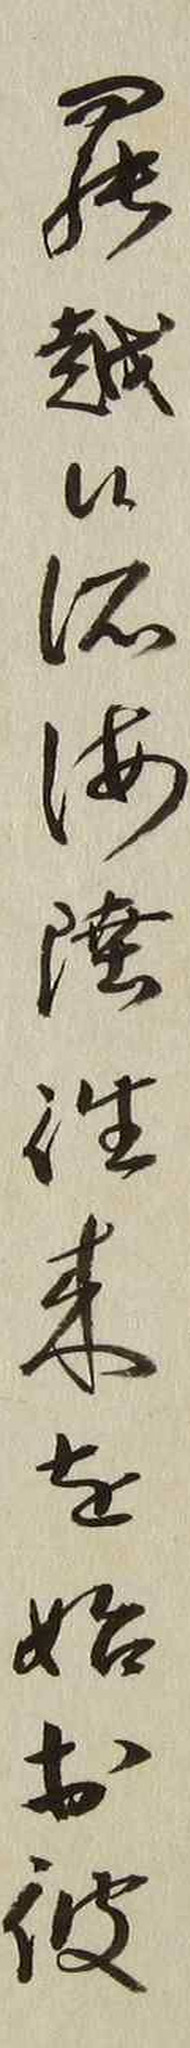罷越候所海陸往来を始於彼
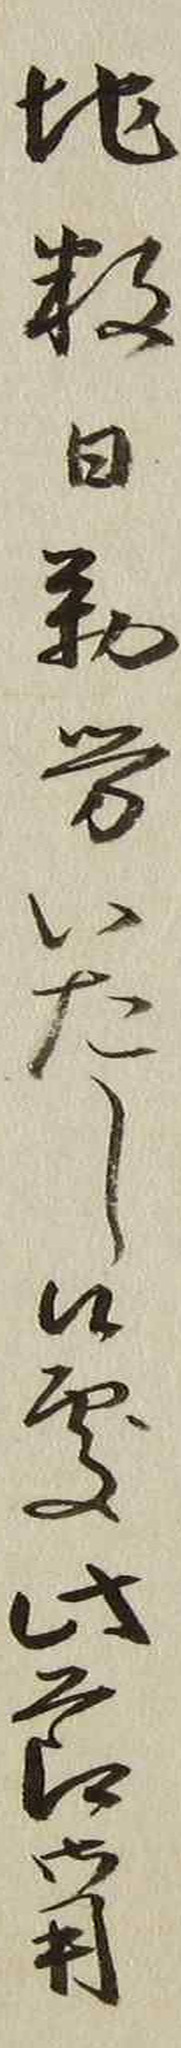地数日勤労いたし候処此節御用
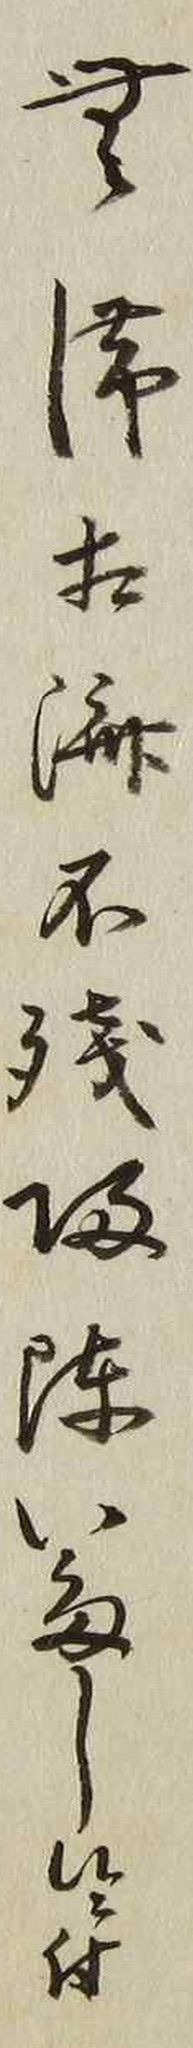無滞相済不残帰陳いたし候ニ付
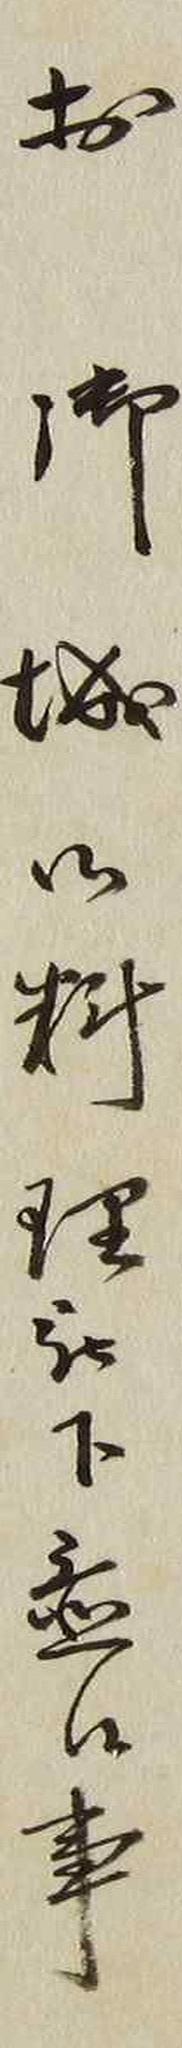於御城御料理被下置候事
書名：諸士系譜　巻之149　そ之部2
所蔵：会津若松市立会津図書館
